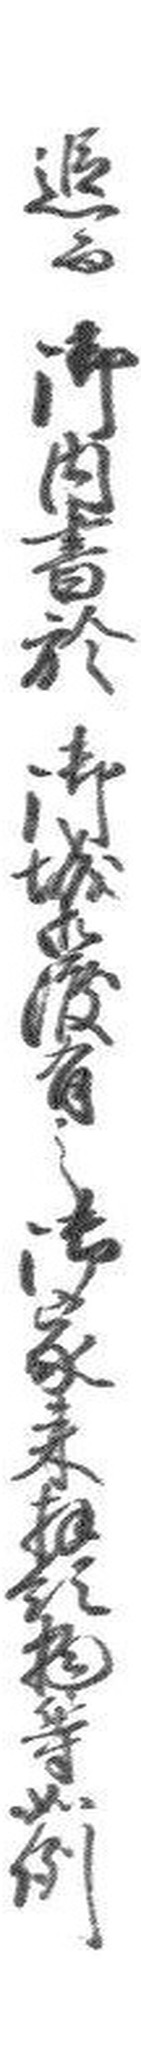追而御内書於御城御渡有之御家来拝領物等如例
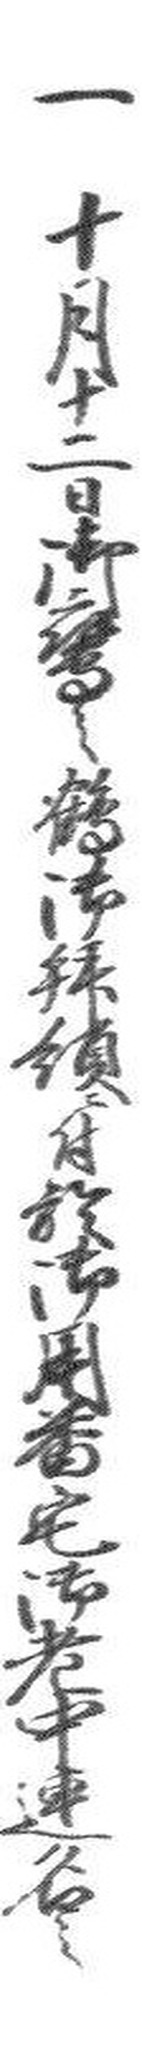一十月十二日御鷹之鶴御拝領ニ付於御用番宅御老中連名之
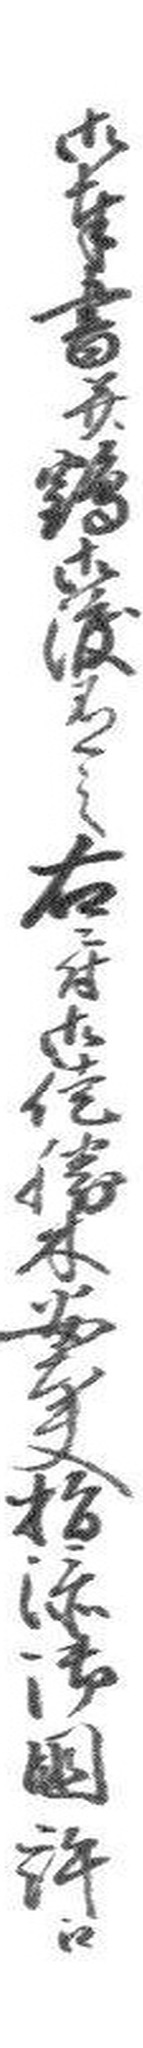御奉書并鶴御渡有之右ニ付御徒勝木安大夫指添御国許江
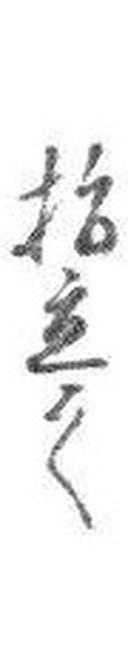指立之
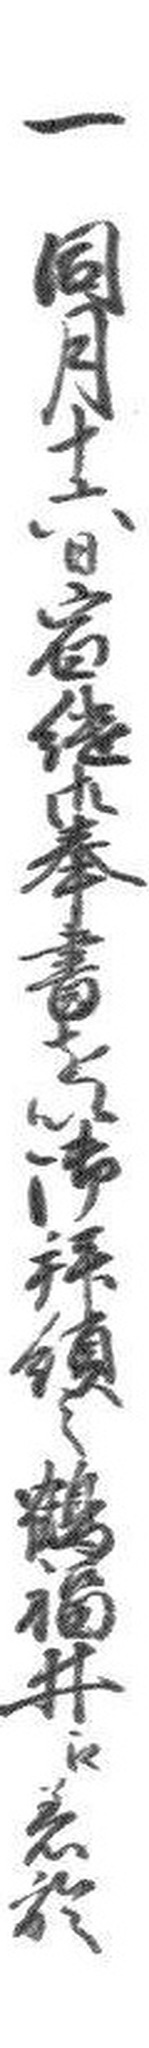一同月十六日宿継御奉書を以御拝領之鶴福井江着於
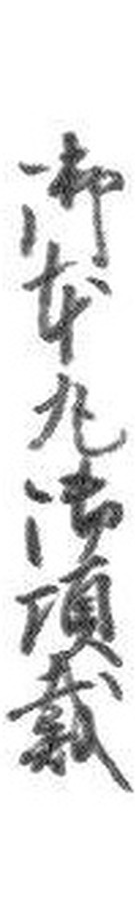御本丸御頂戴
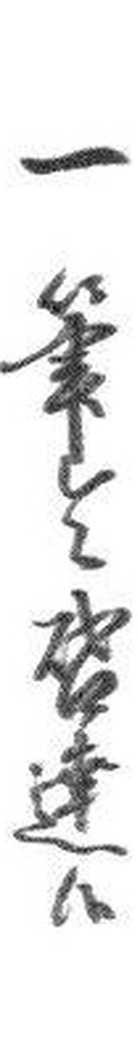一筆令啓達候

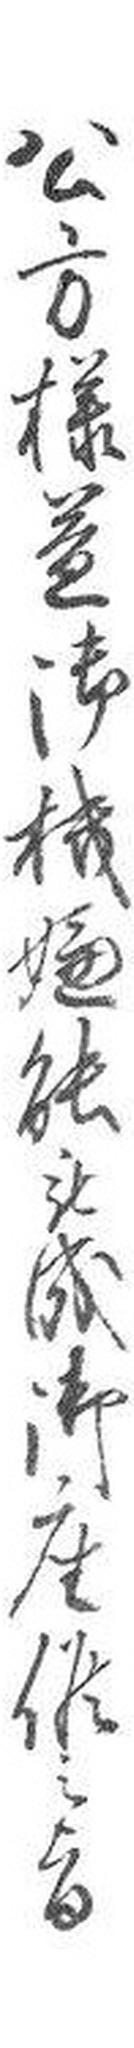公方様益御機嫌能被成御座候之旨
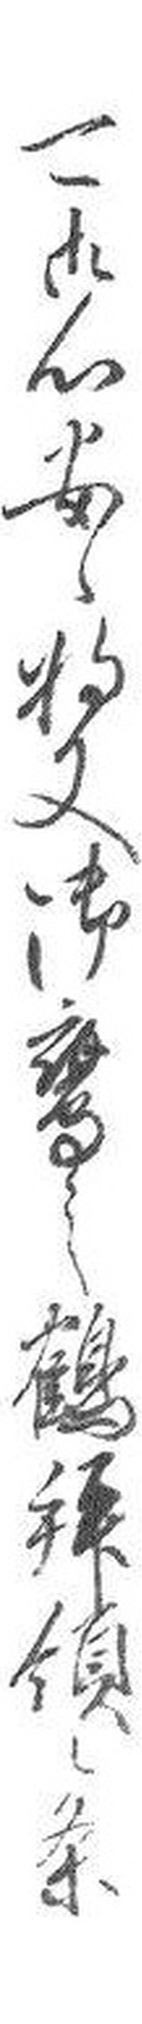可御心安候将又御鷹之鶴拝領候条
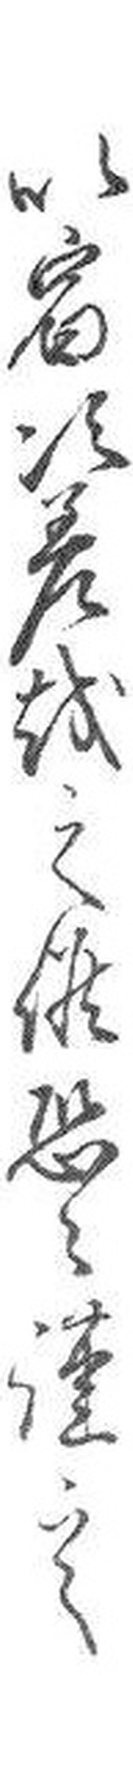以宿次差越之候恐々謹言
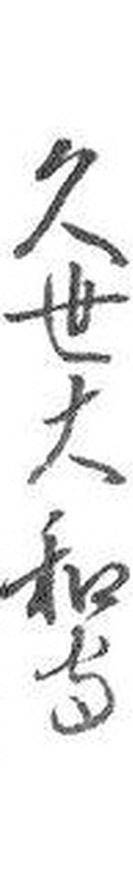久世大和守
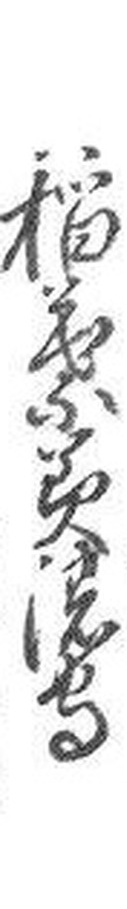稲葉美濃守
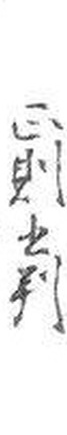正則書判
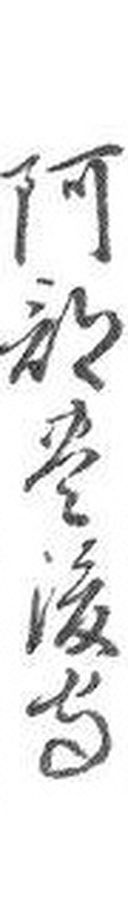阿部豊後守
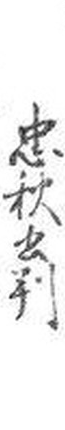忠秋書判
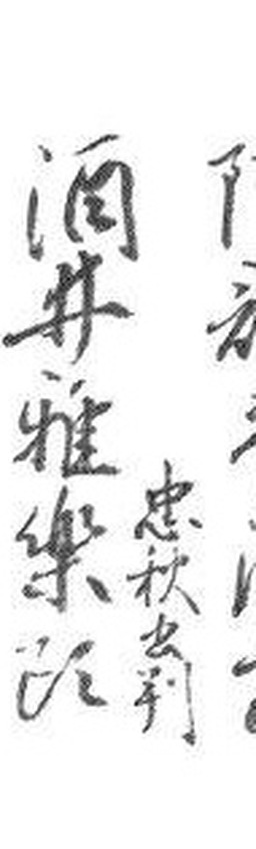酒井雅樂頭
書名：家譜 六 光通公 従万治三年到寛文三年
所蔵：福井県文書館 Fukui Prefectural Archives
